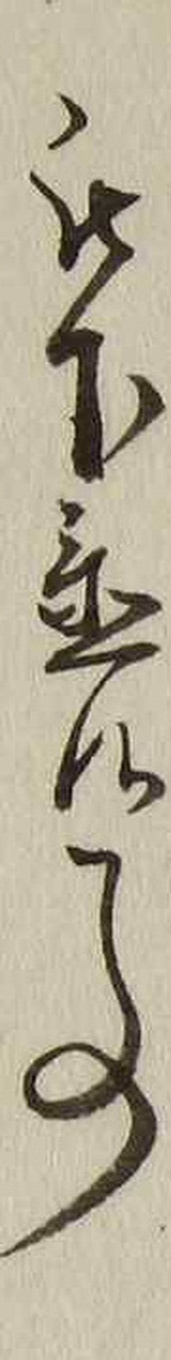被下置候事
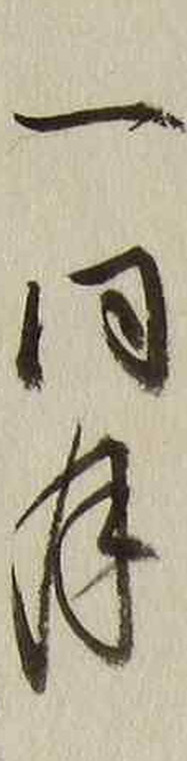一同月
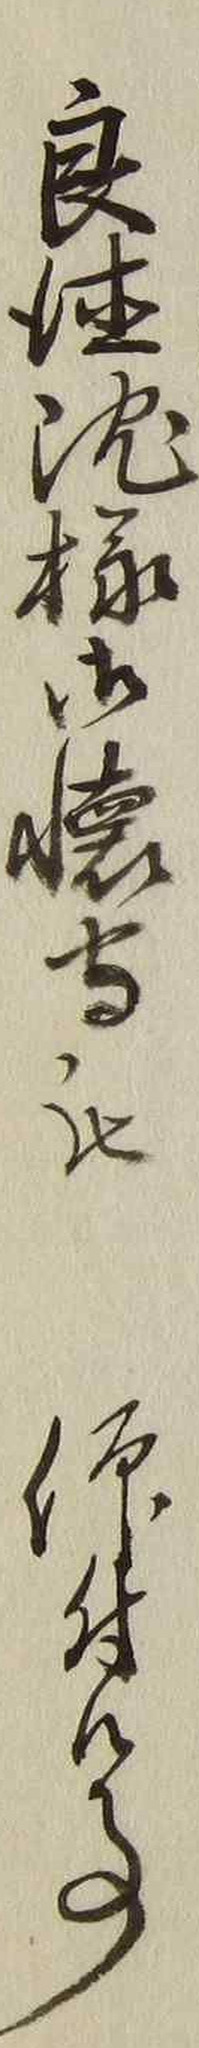良徳院様御懐守被仰付候事
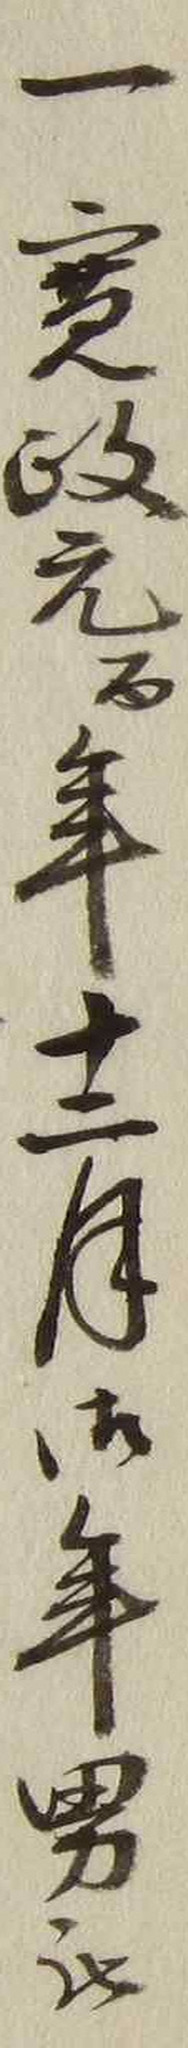一寛政元酉年十二月御年男被
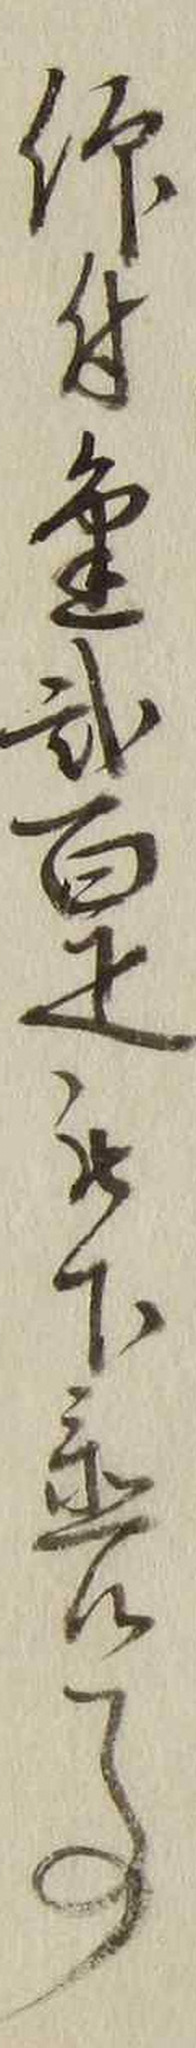仰付金弐壱百疋被下置候事

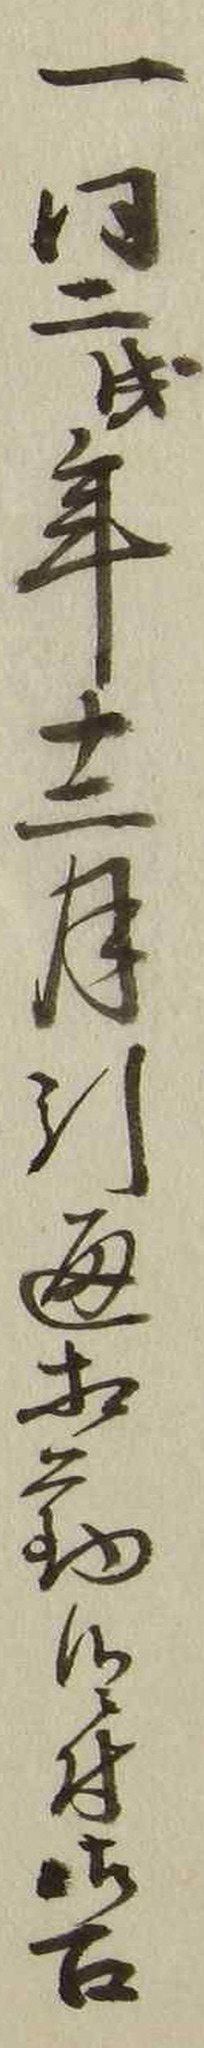一同二戌年十二月引通相勤候ニ付御召
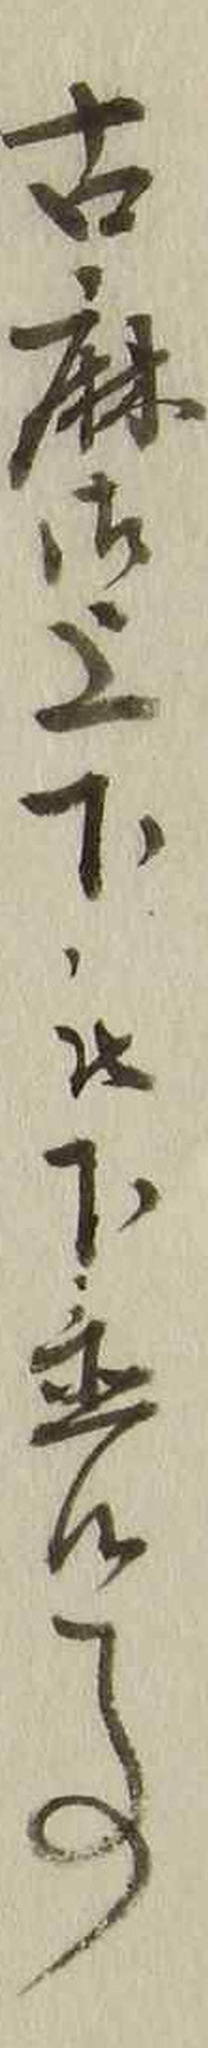古麻御上下被下置候事
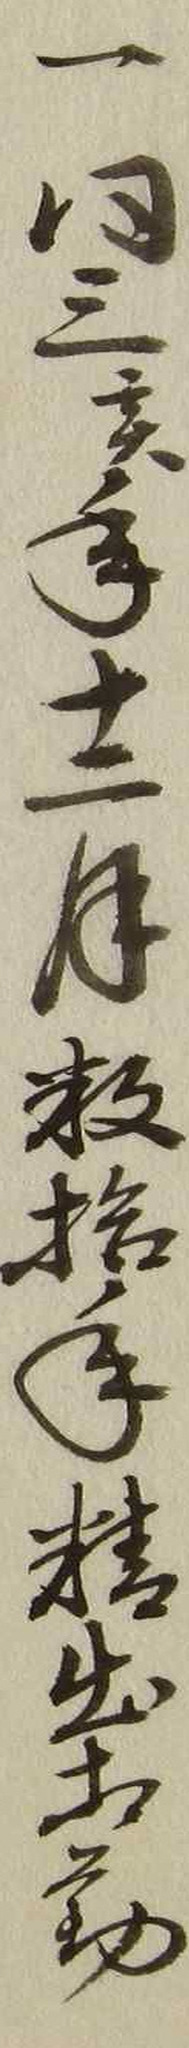一同三亥年十二月数拾年精出相勤
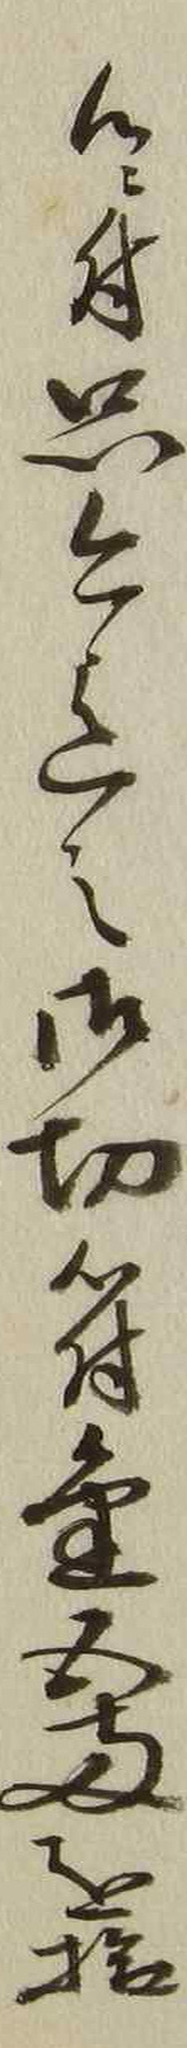候ニ付只今迄之御切符金五両を拾
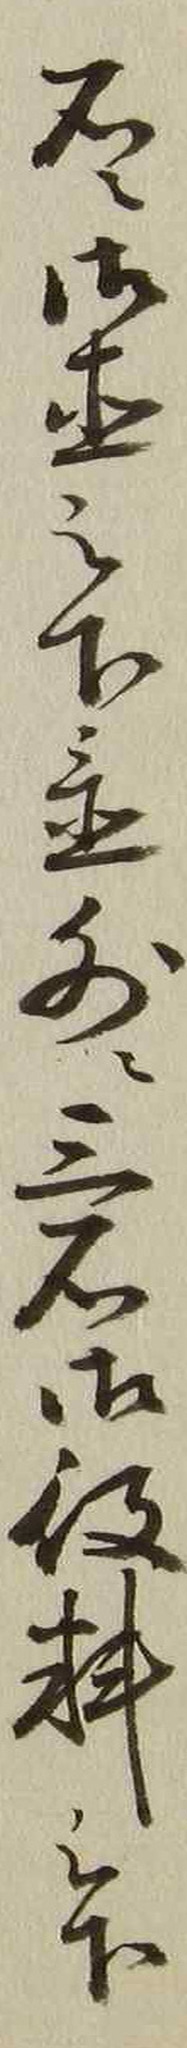石ニ御直被下置外ニ三石御役料被下
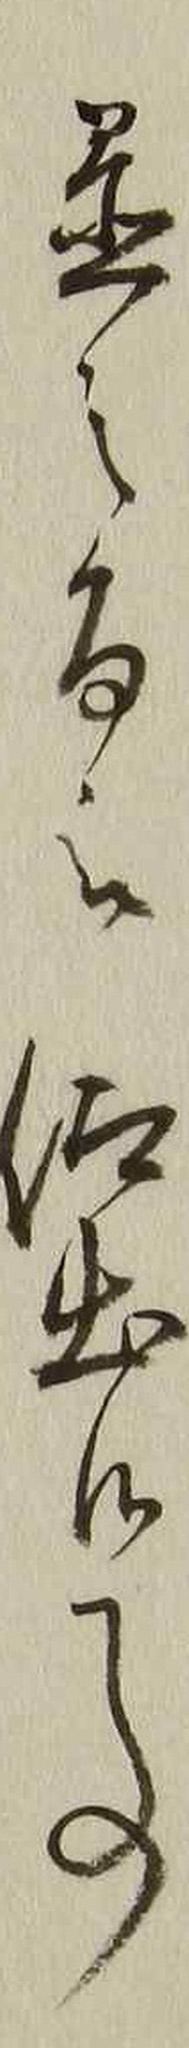置之旨被仰出候事
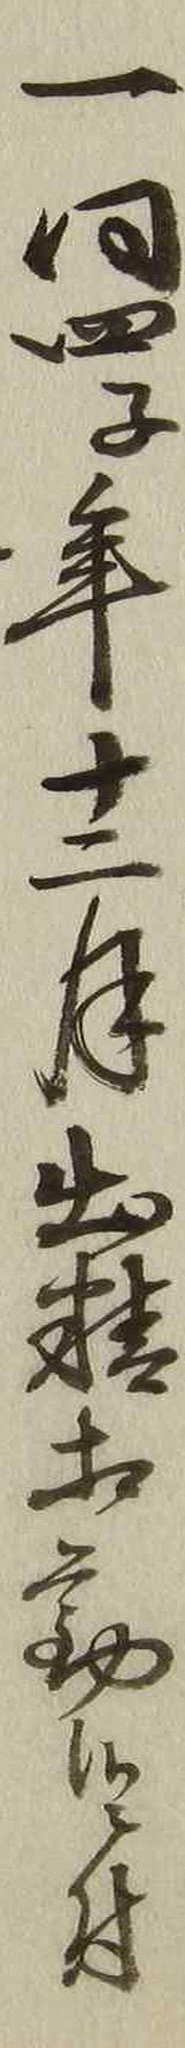一同四子年十二月出精相勤候ニ付
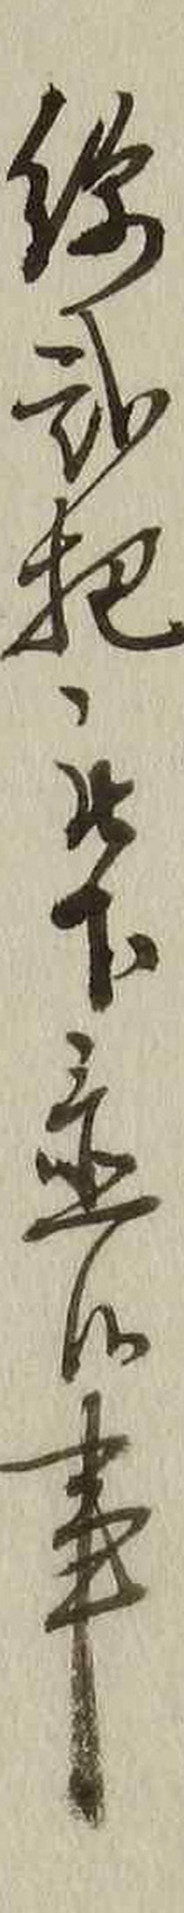綿弐把被下置候事
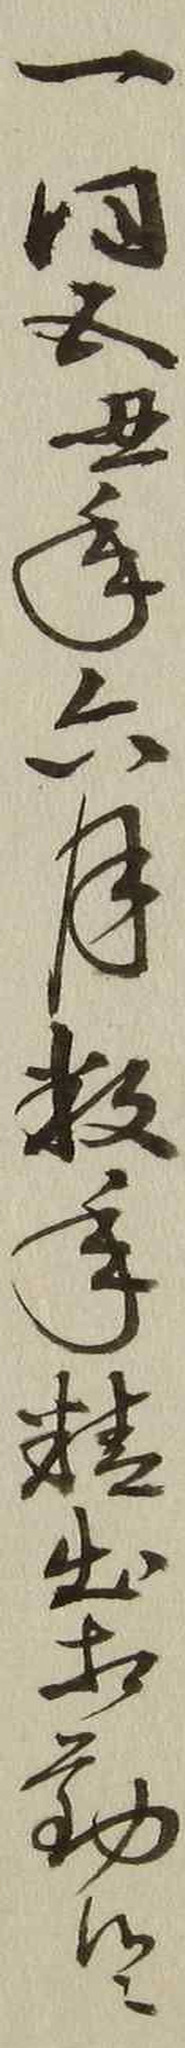一同五丑年六月数年精出相勤候ニ
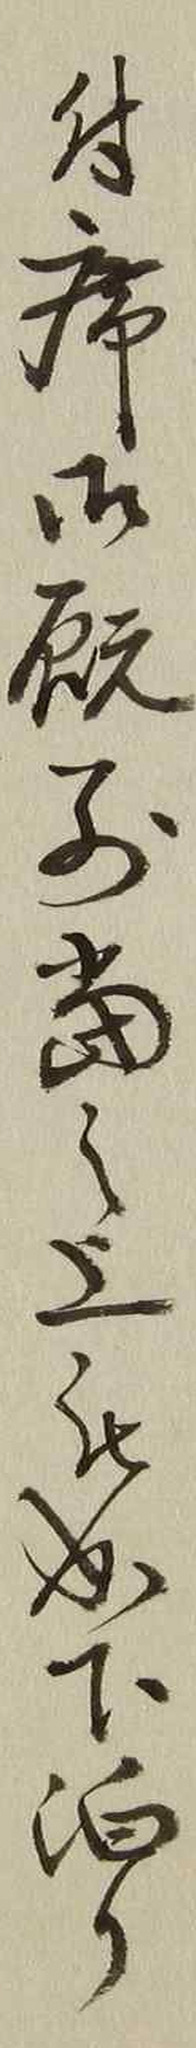付席御厩別当之上被成下泊り
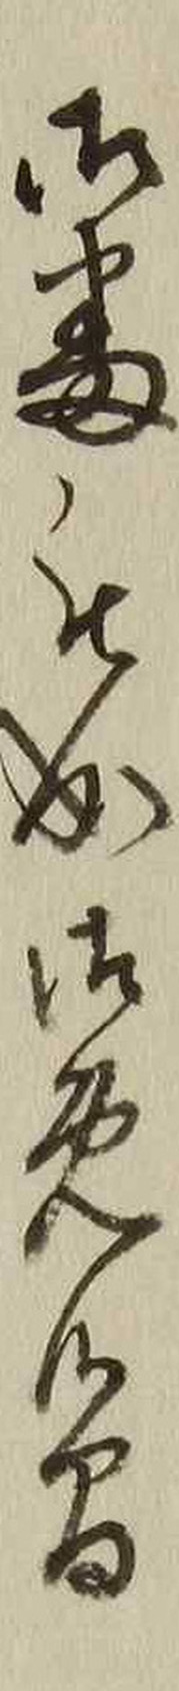御番被成御免候間
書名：諸士系譜　巻之31　い之部31
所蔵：会津若松市立会津図書館
